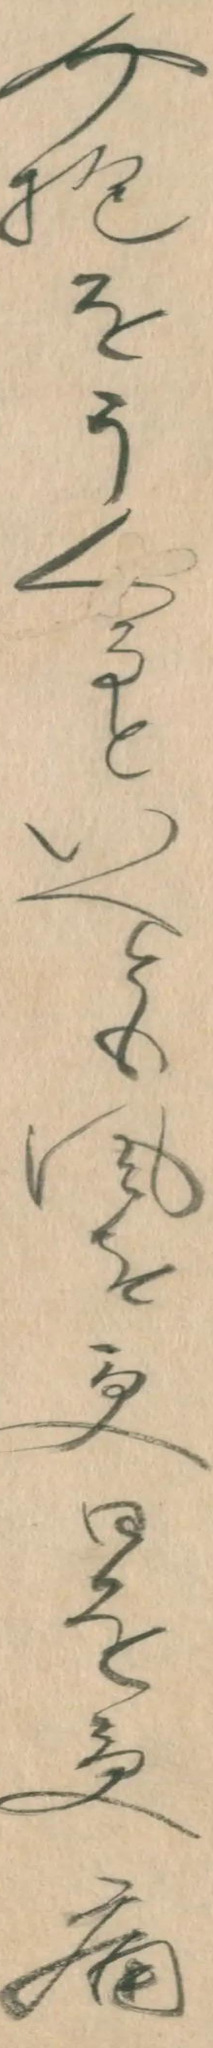介抱をうくるといへとも風を受日を受痛
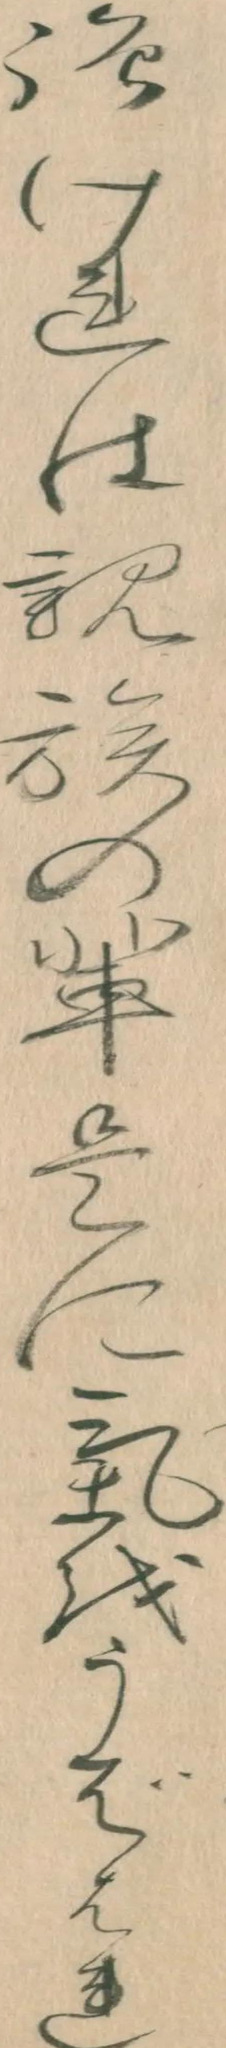強けれは親族の輩是に気をうばはれ
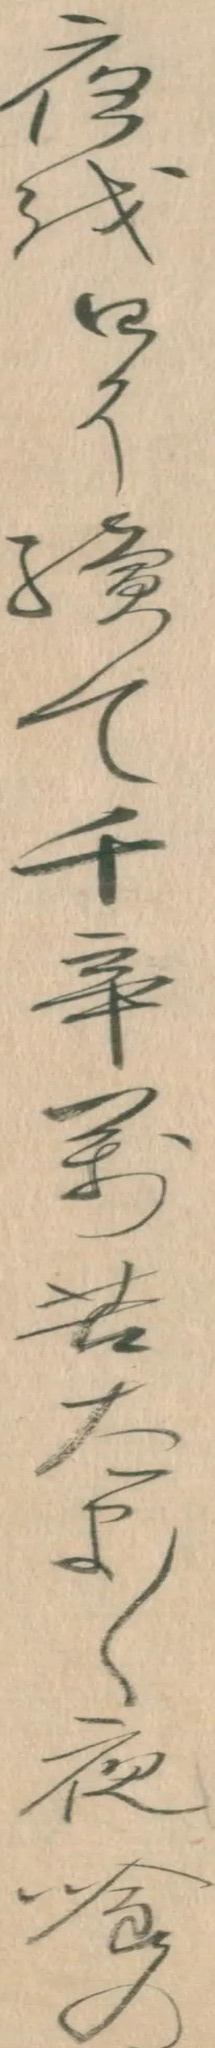夜を日に続て千辛万苦たま〳〵夜喰の
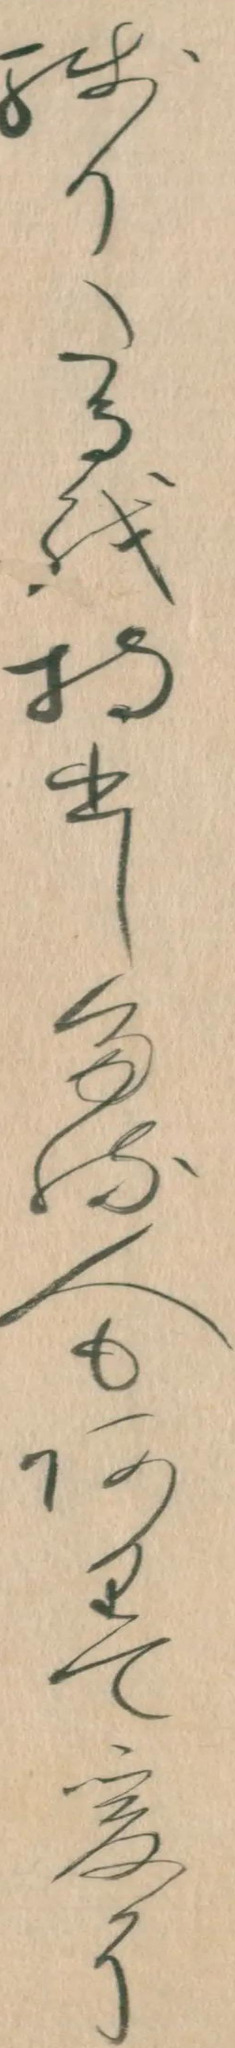残りたるを持出したる人もありて爰に
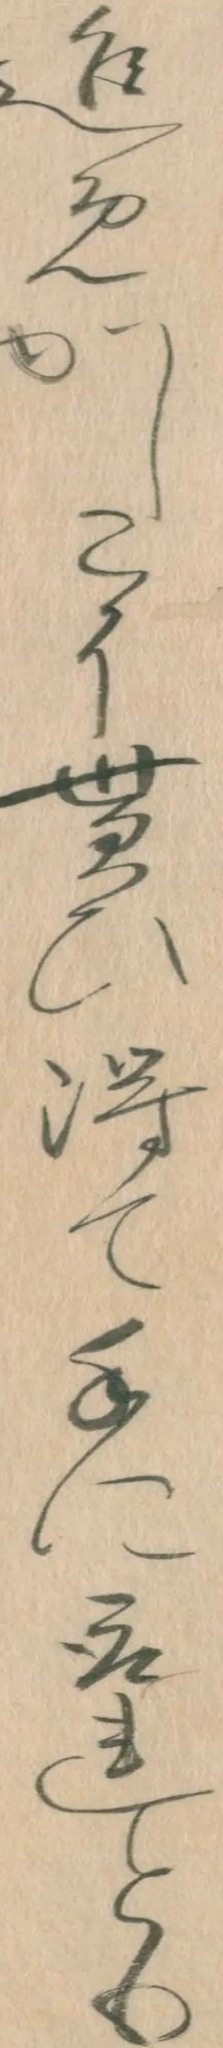進めかしこに貰ひ得て手に取れとも
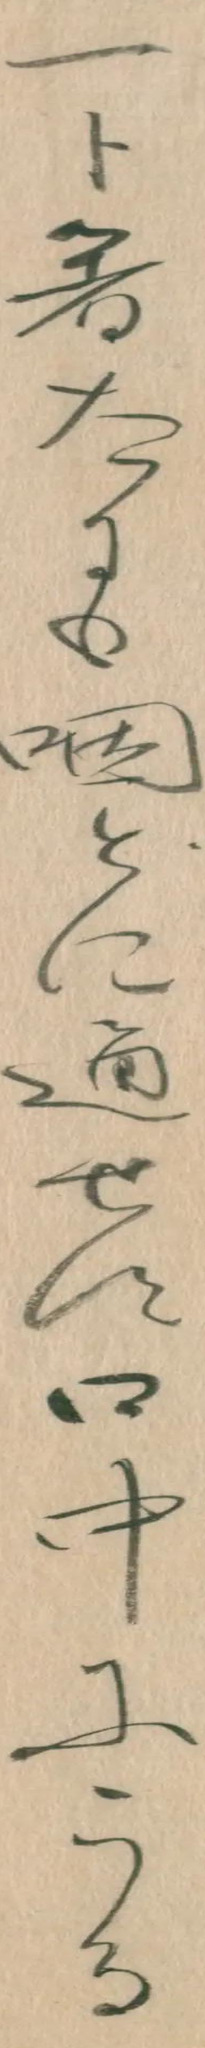一ト箸たにも咽どに通せす口中にうる
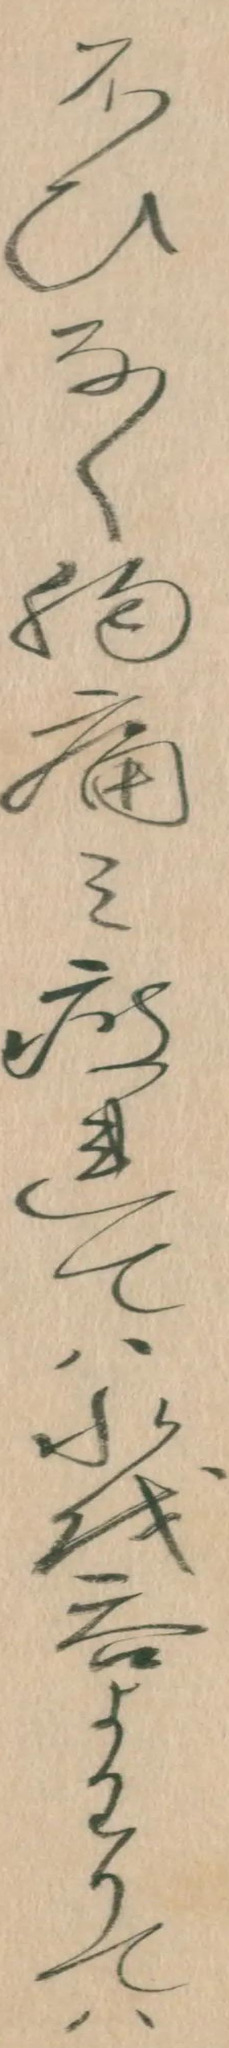ほひなく胸痛み疲れては水を呑よわりては
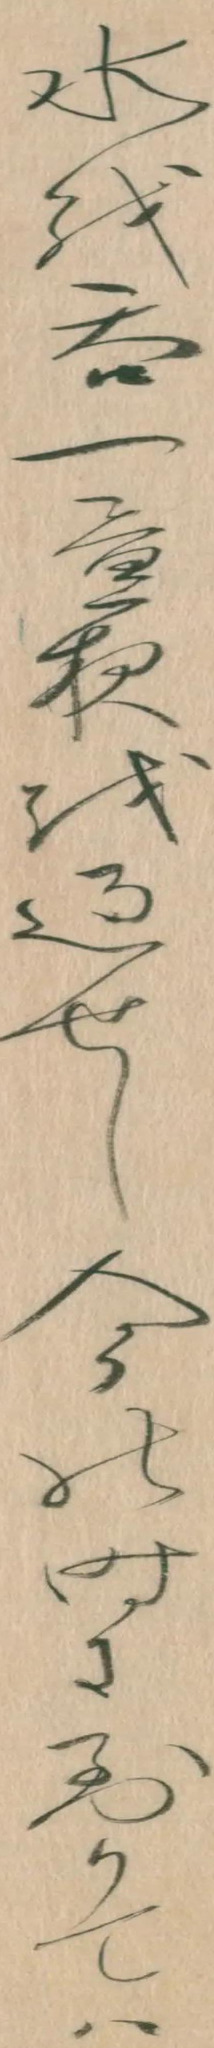水を呑一昼夜を過せし今の時に到りては
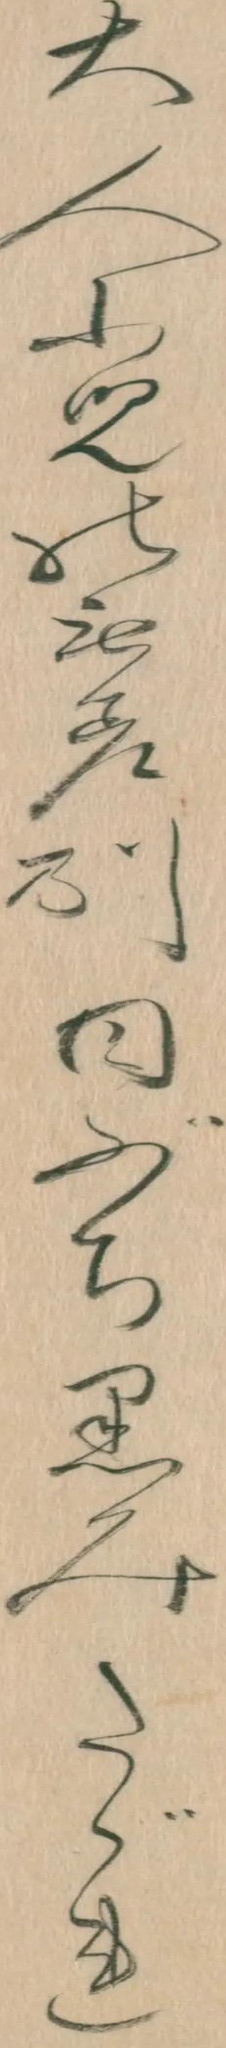大人小児の無差別目ぶち黒みたゞれ
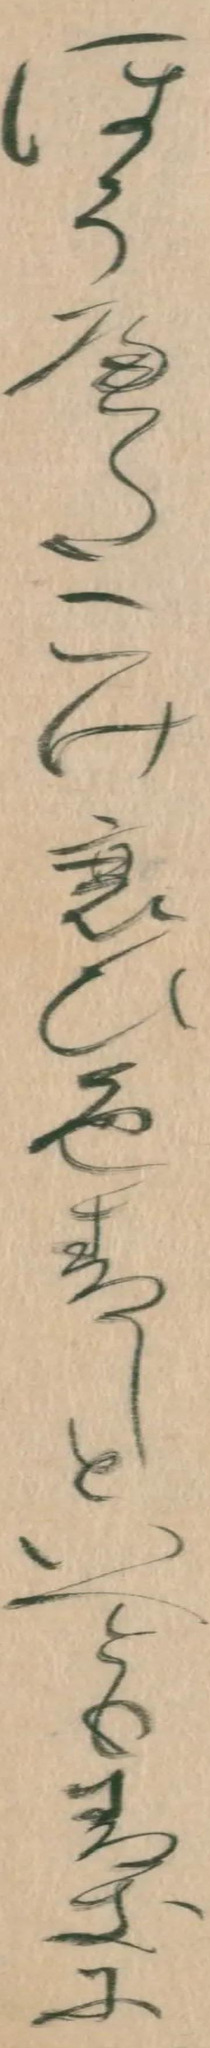ほうへたこけ衰ひ色青しといへとも青きに
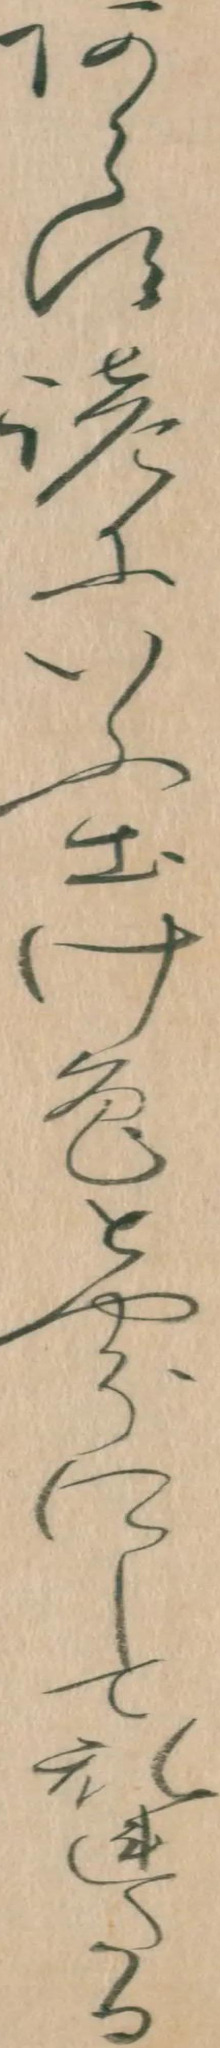あらす諺にいふ土け色とやらにして乱れたる
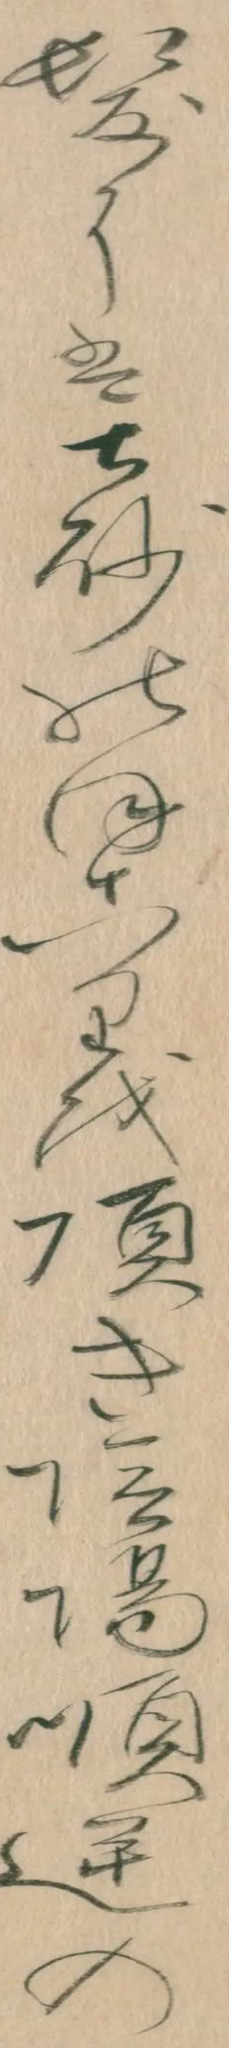髪には土砂のほこりを頂き陰陽順逆の
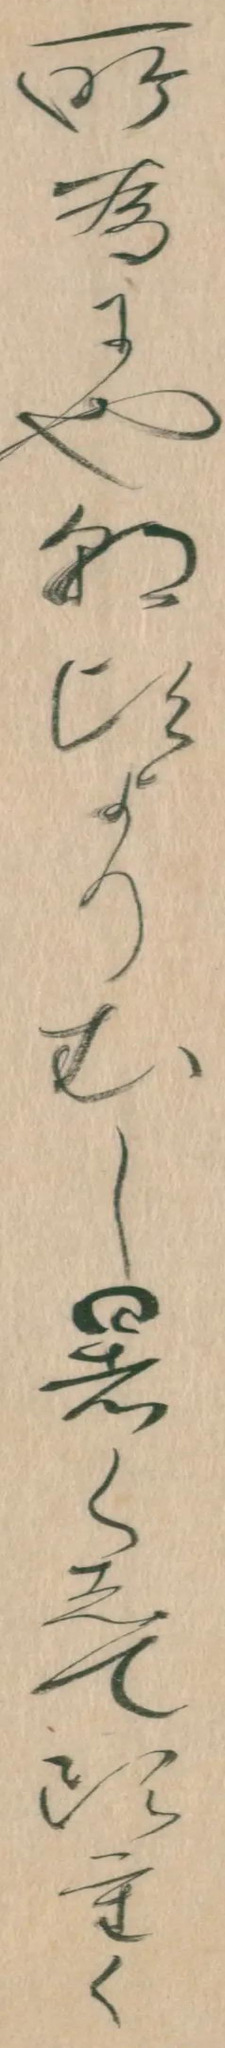所為にや朝頃よりむし暑くして頭重く
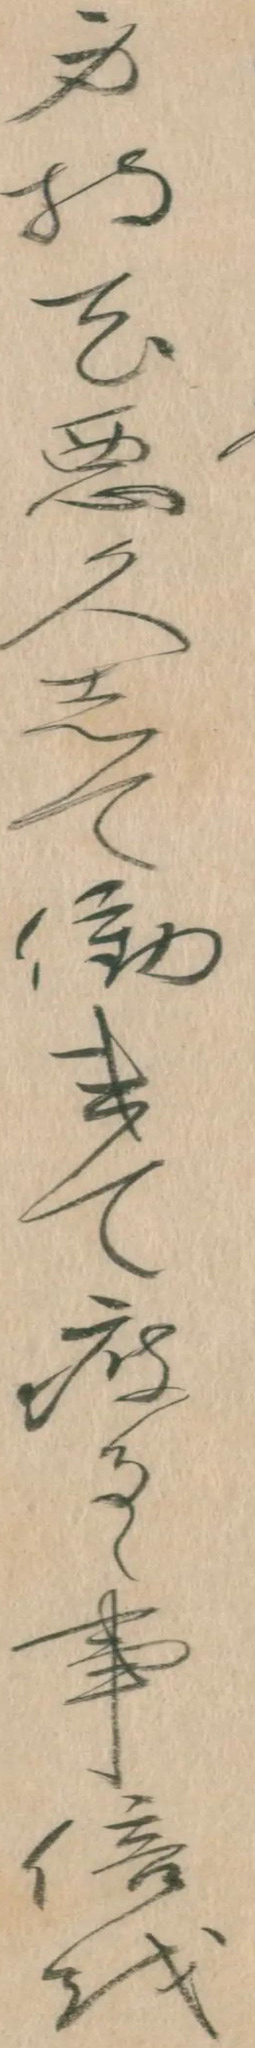身持尤悪くして働きて疲るゝ事倍を
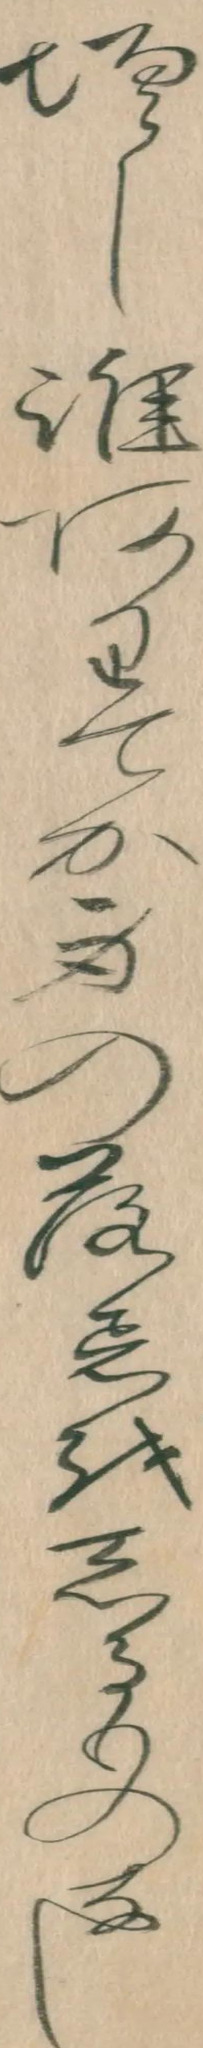増し誰ありてか身の落着をしるものなし
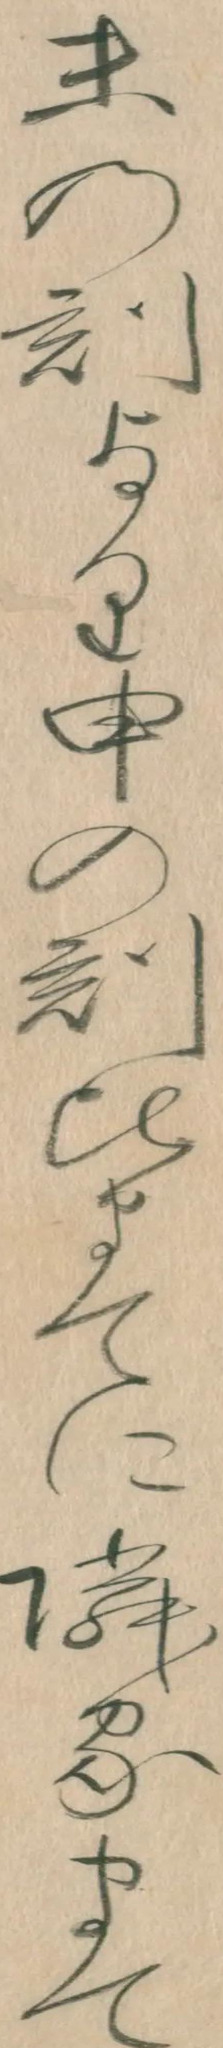未の刻より申の刻比まてに隣家まて
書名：俗語之種. [4]
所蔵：国立国会図書館 National Diet Library, JAPAN
